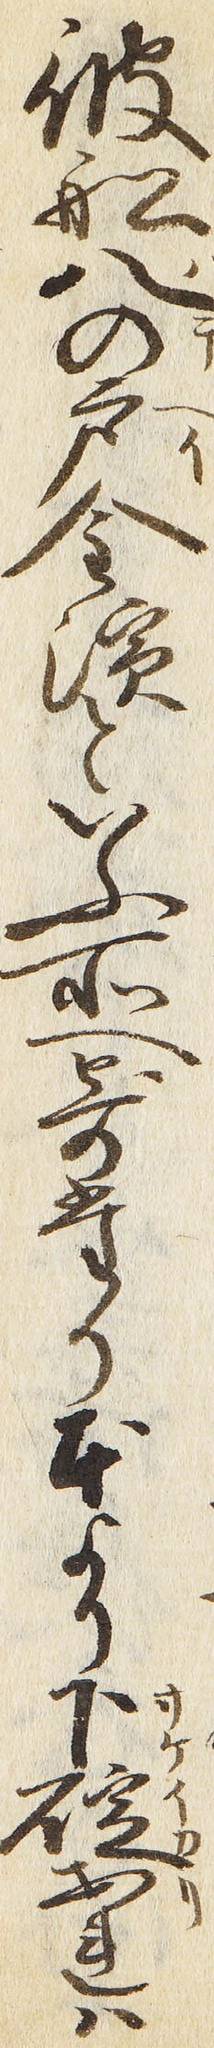彼船八の戸金浜といふ所へ寄たり本より下碇あれは
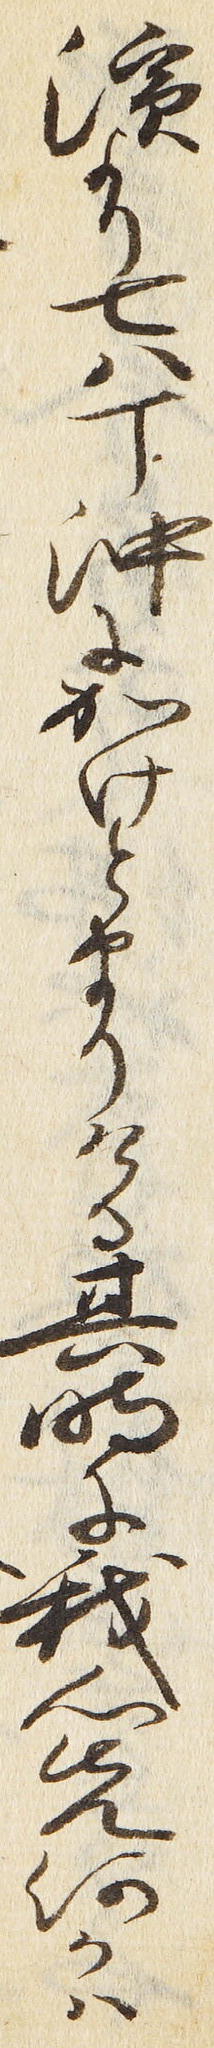浜より七八丁沖にかけとまりける其時に我心先何かは
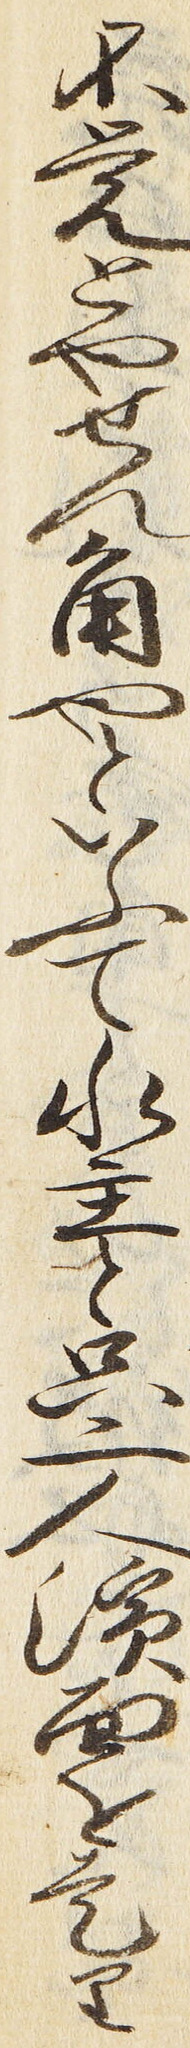不覚とやせん角やといふて水主と只二人浜面を走り
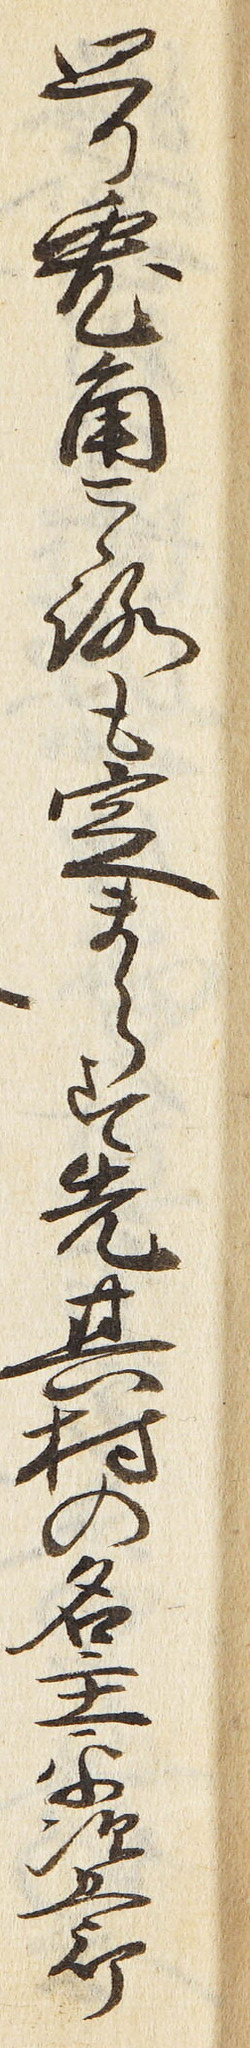廻り兎角こころも定まらす先其村の名主平次五郎
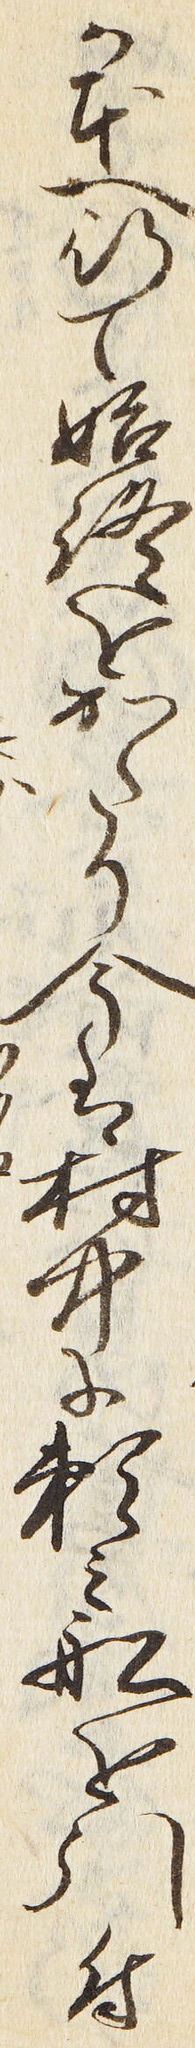か本へ行て始終をかたり今は村中に頼ミ船を引付
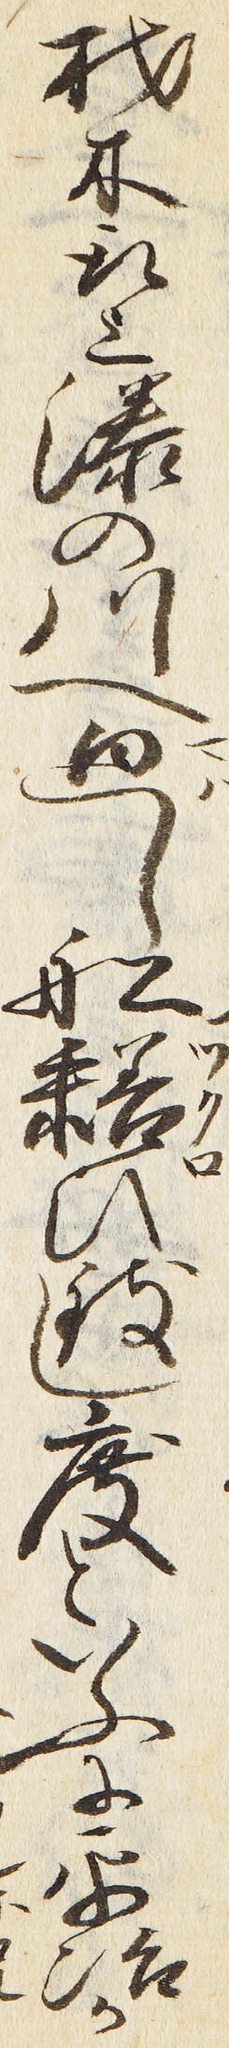材木取上湊の川へ廻し船繕ひ致し度といふに平治か
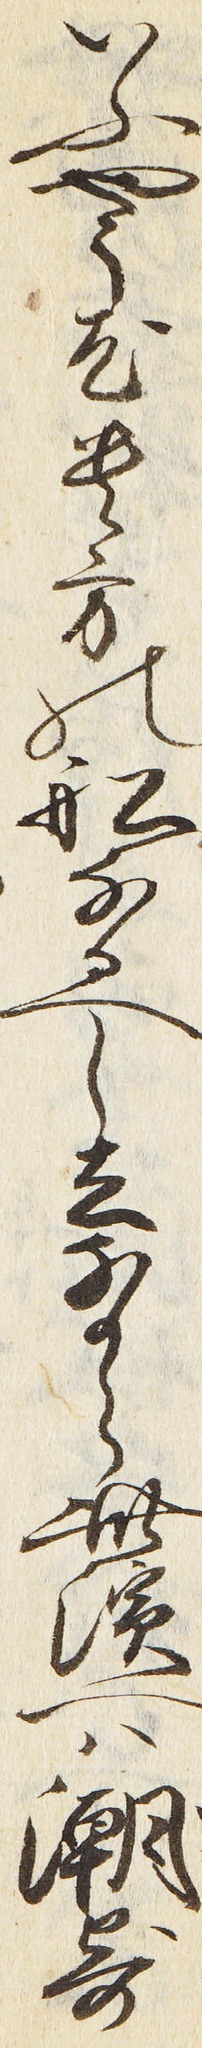いふやう尤貴方の船なるへし去なから此浜へは潮寄
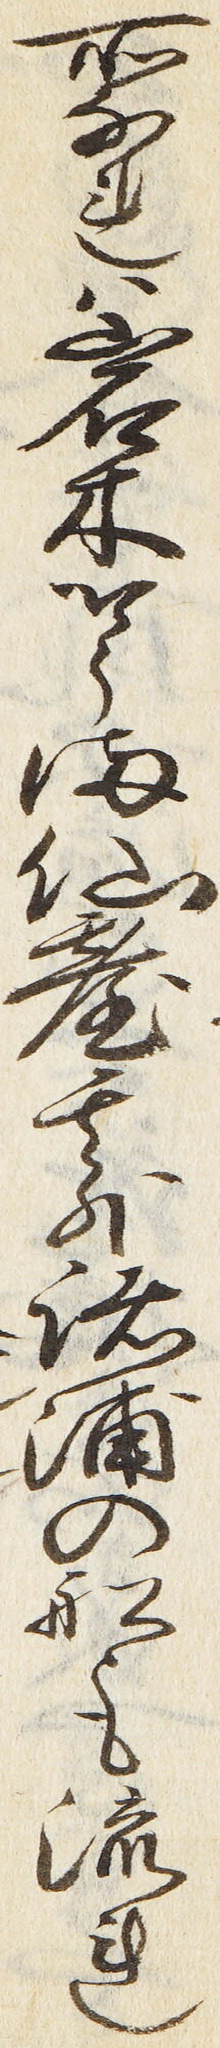所なれは岩木そうま仙台其外諸浦の船とも流れ
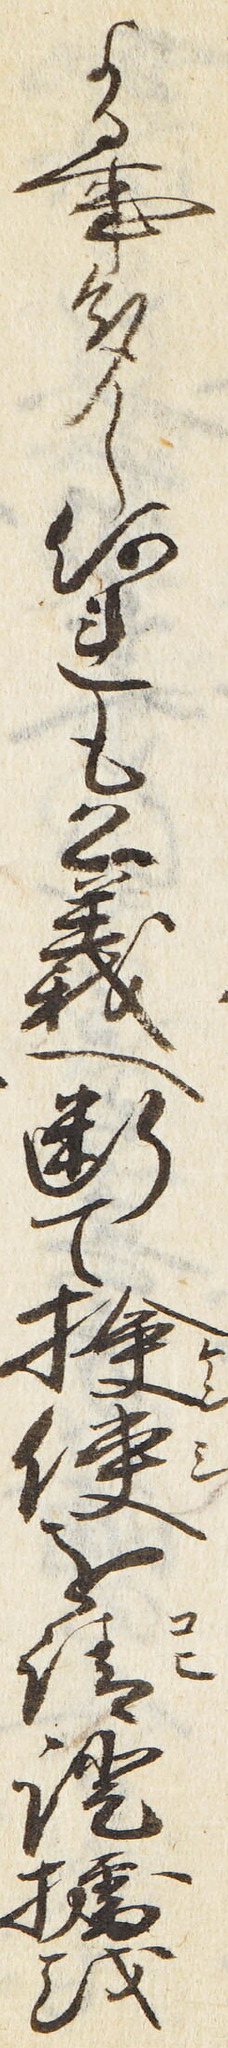よる事多く何れも公義へ断て検使を請証拠を
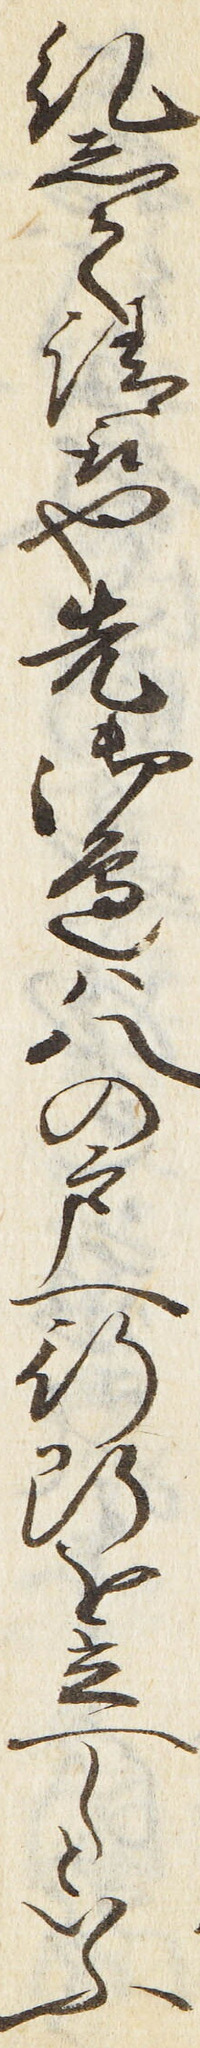糺して請取也先御辺ハ八の戸へ行断を立へしといふ
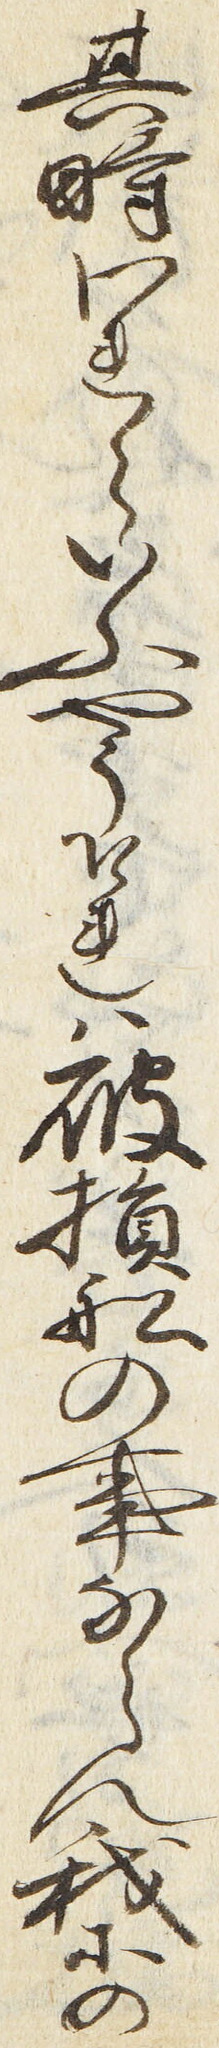其時われらいふやうそれは破損船の事ならん我等の
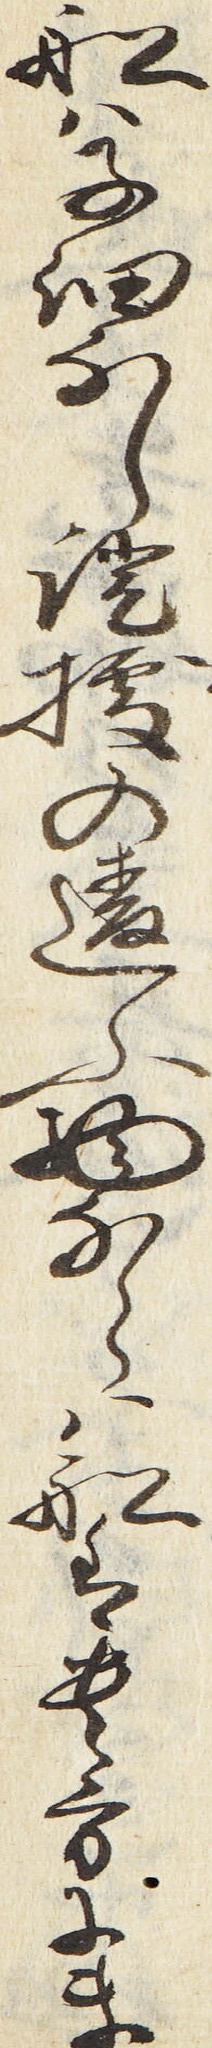船は子細なし証拠の違ふ物ならは船は貴方にま

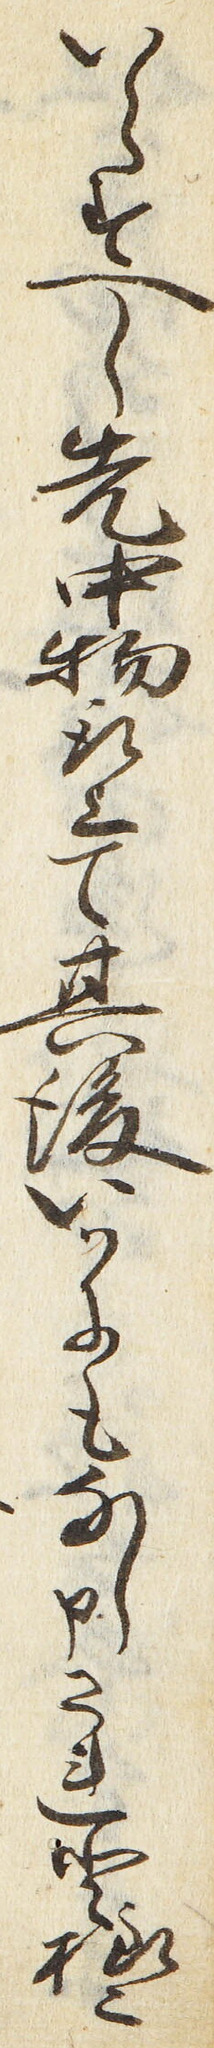いらすへし先中物取上て其後いかにもなし申されと様々
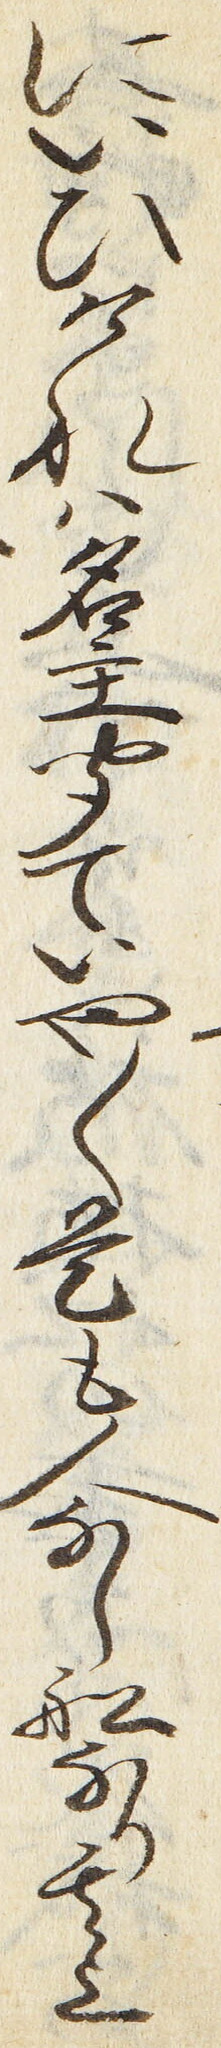にいひけれは名主聞ていや〳〵是も人なし船なり其上
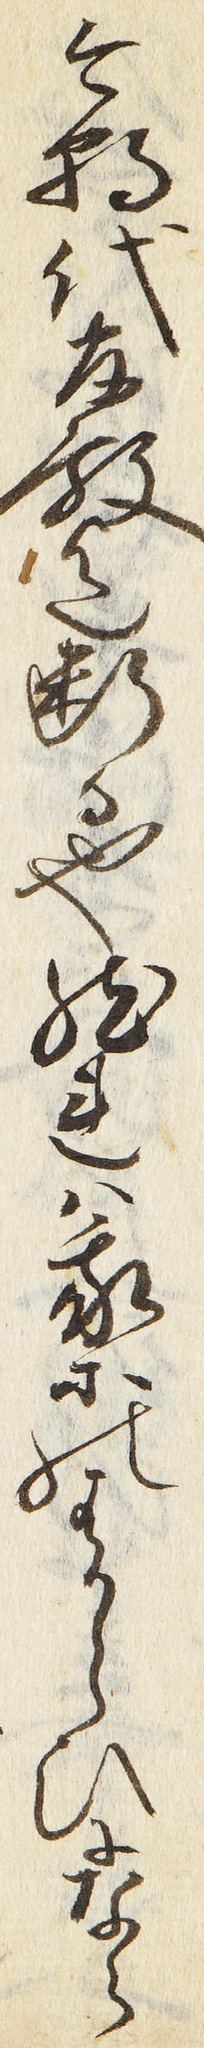今朝代官殿迄断る也然れは我等のはからひになら
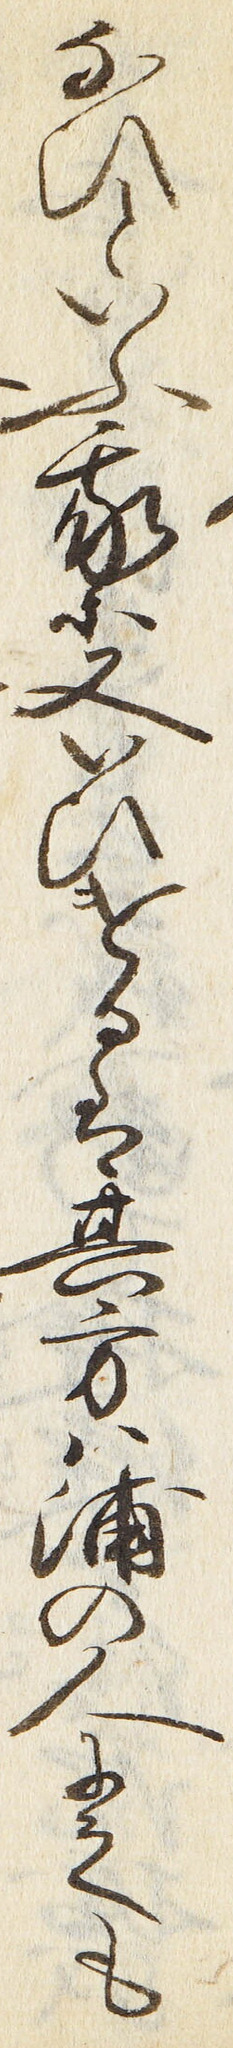なひといふ我等又いひけるは其方は浦の人にても
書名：海陸世話日記
